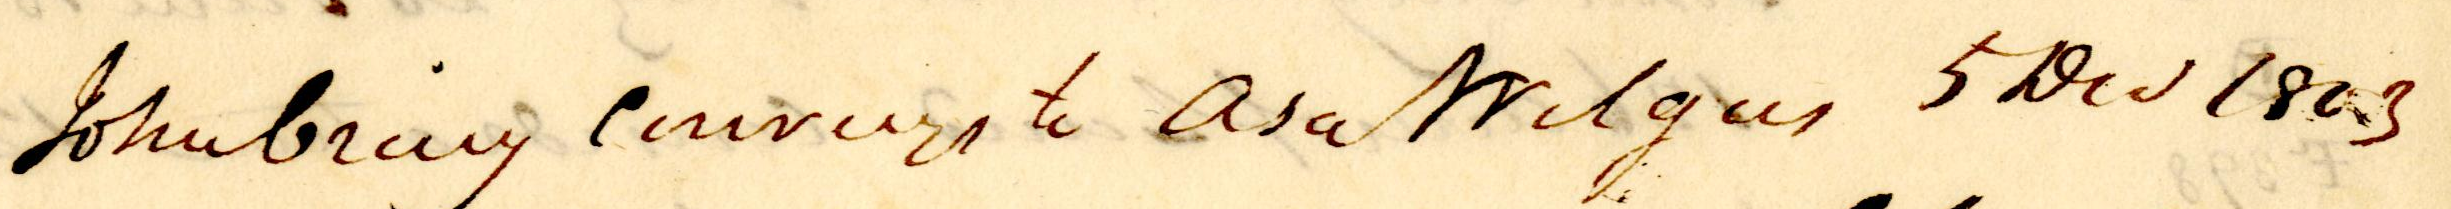John Gray conveys to Asa Wilgus 5 Dec 1803
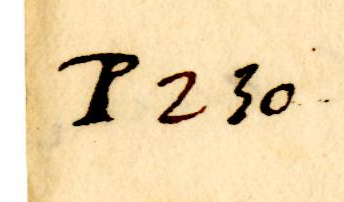P230
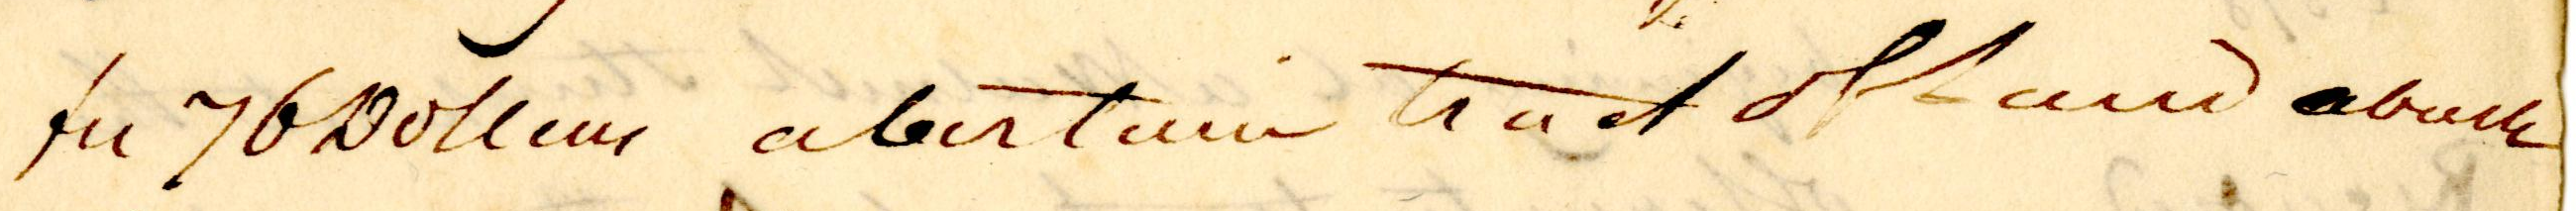for 76 Dollars a certain tract of land about
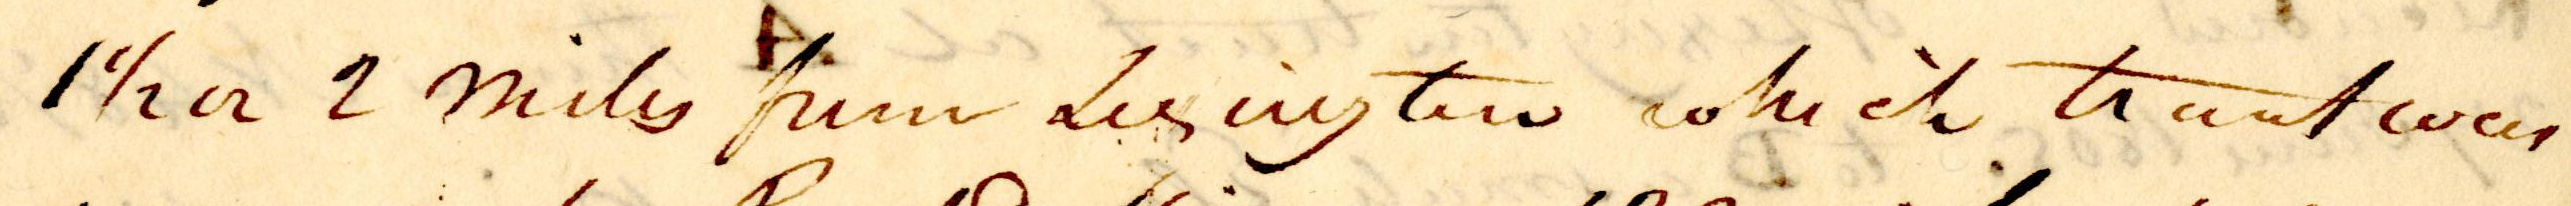1 1/2 or 2 miles from Lexington which tract was
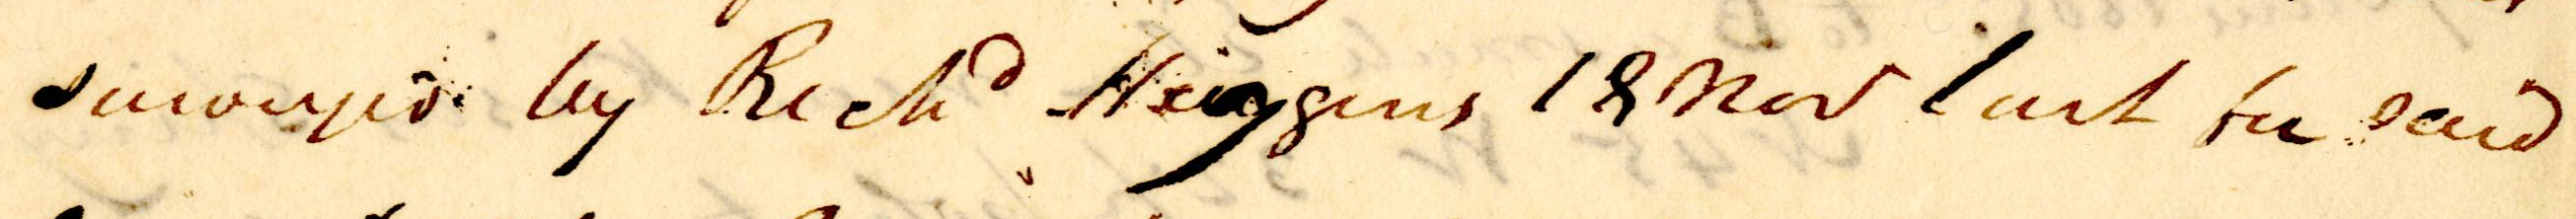surveyed by Rich^d Higgens 18 Nov last for send
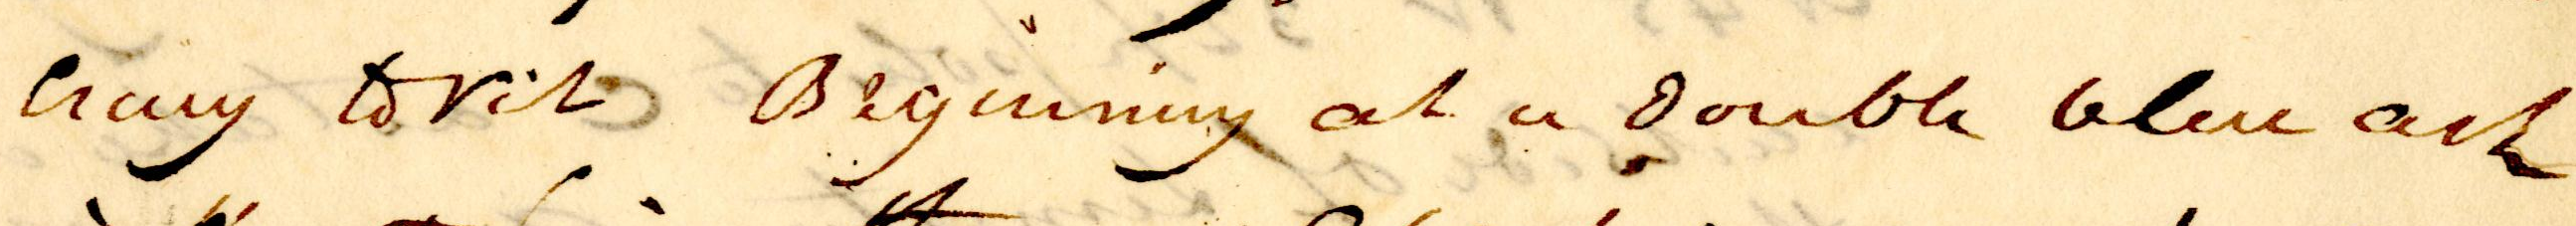Craig to vit Beginning at a double blue act
